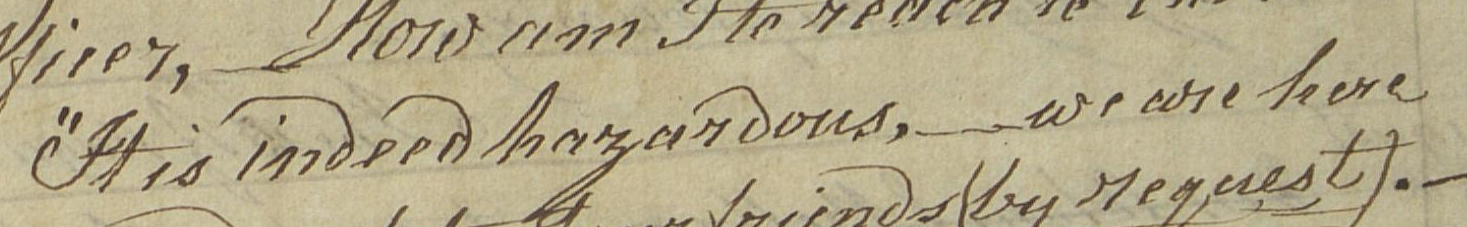"It is indeed hazardous, we are here
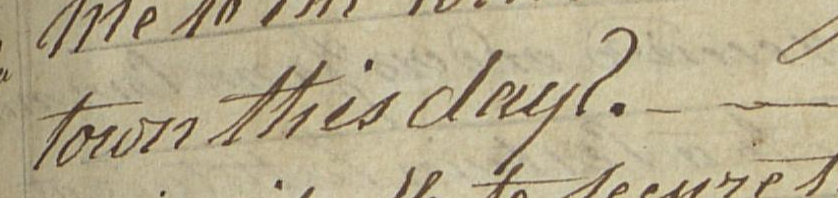town this day?
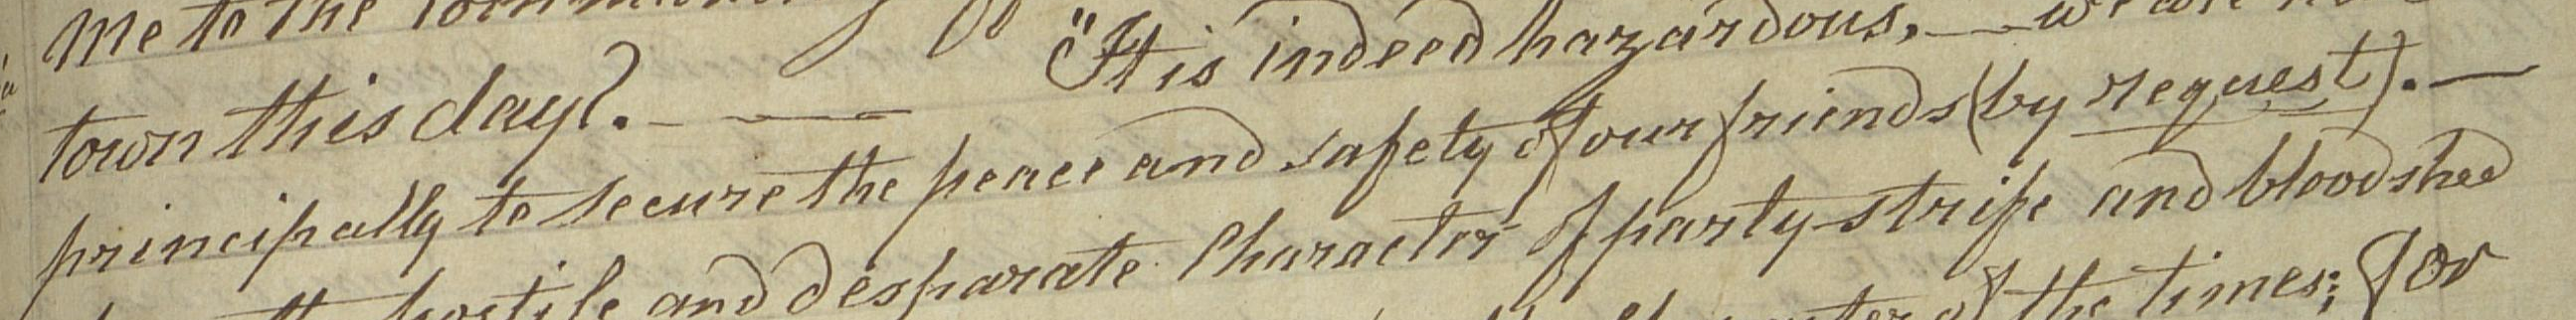principally to secure the peace and safety of four friends (by request).
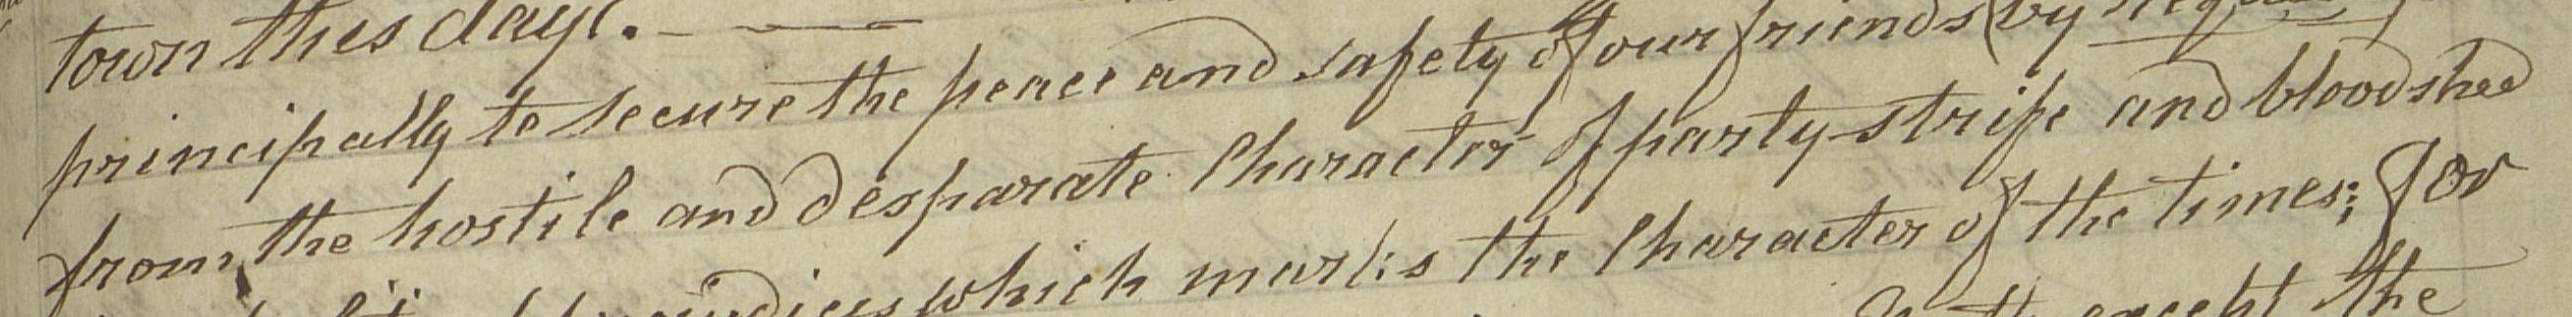from the hostile and desperate character of party strife and bloodshed
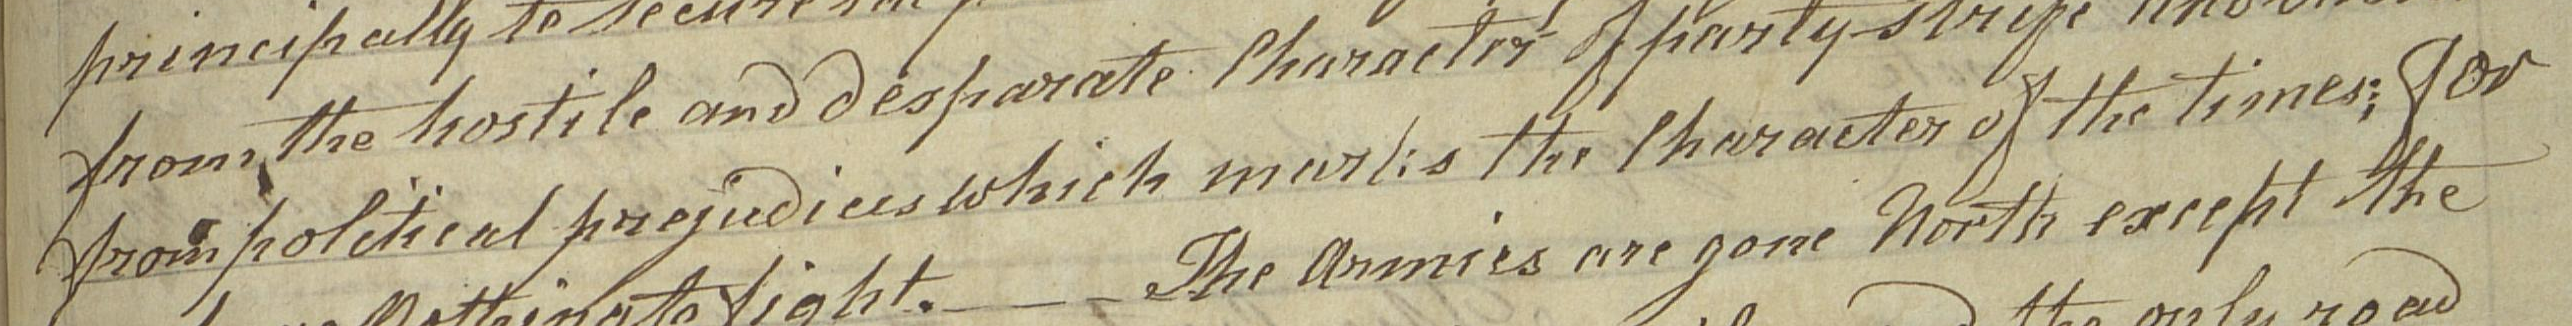from political prejudices which marks the Character of the times; for
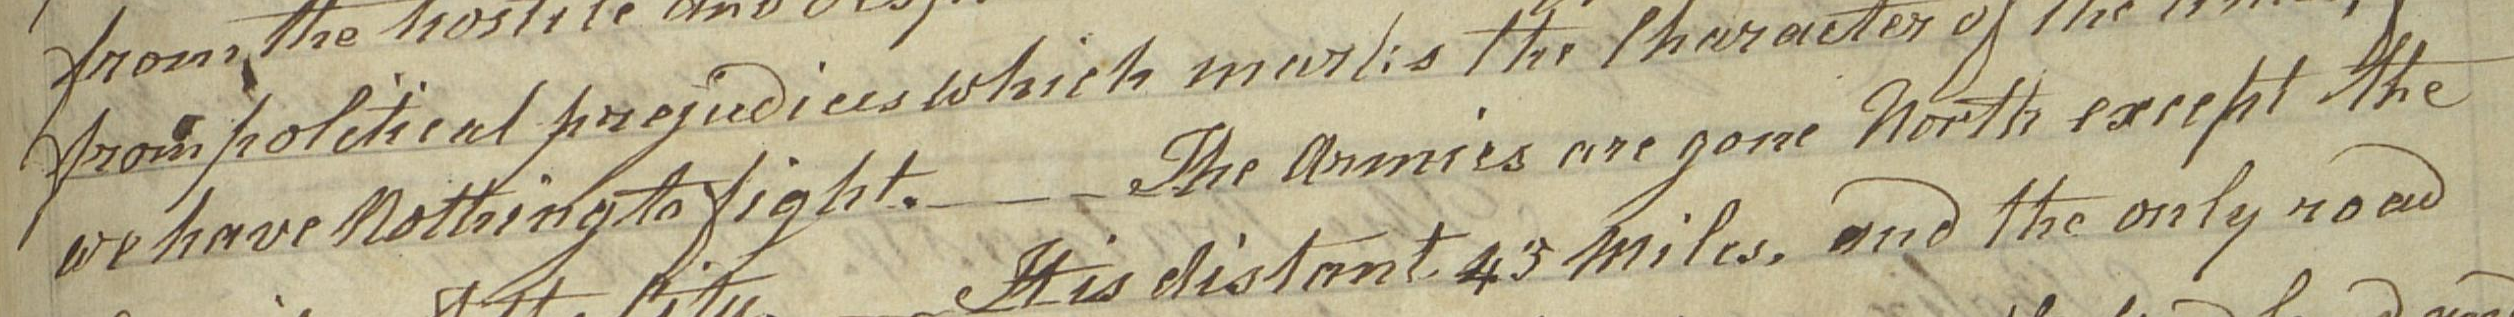we have Nothing to fight. The Armies are gone North except the
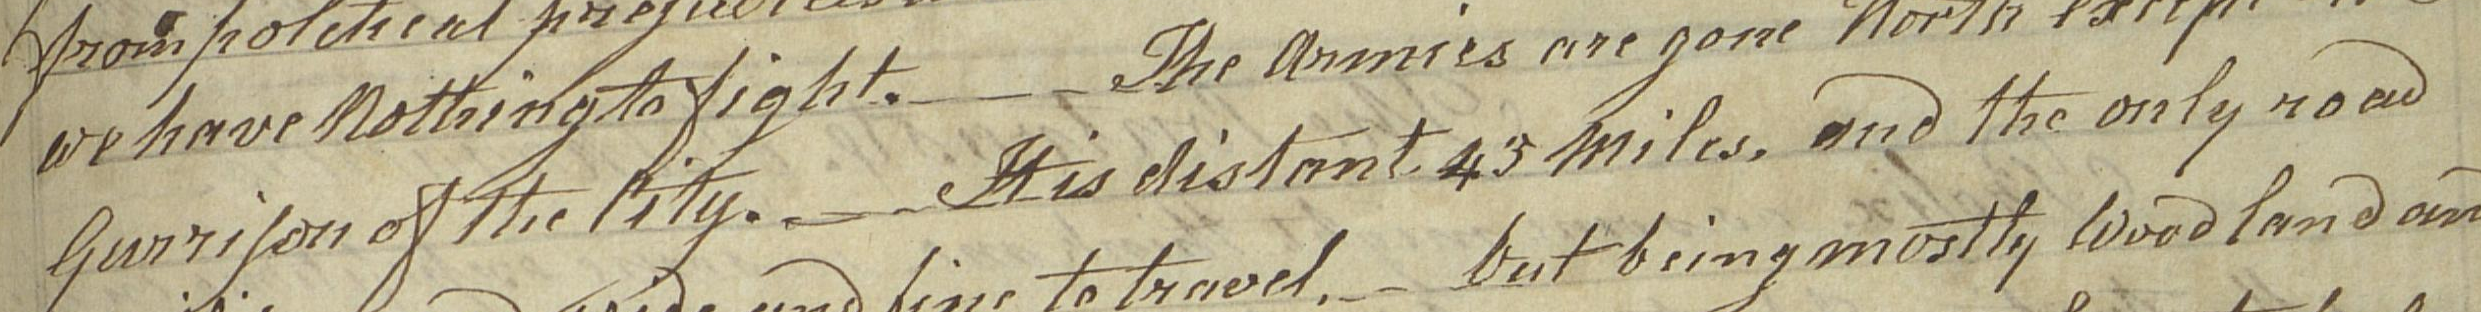Garrison of the City. It is distant 43 Miles, and the only road
